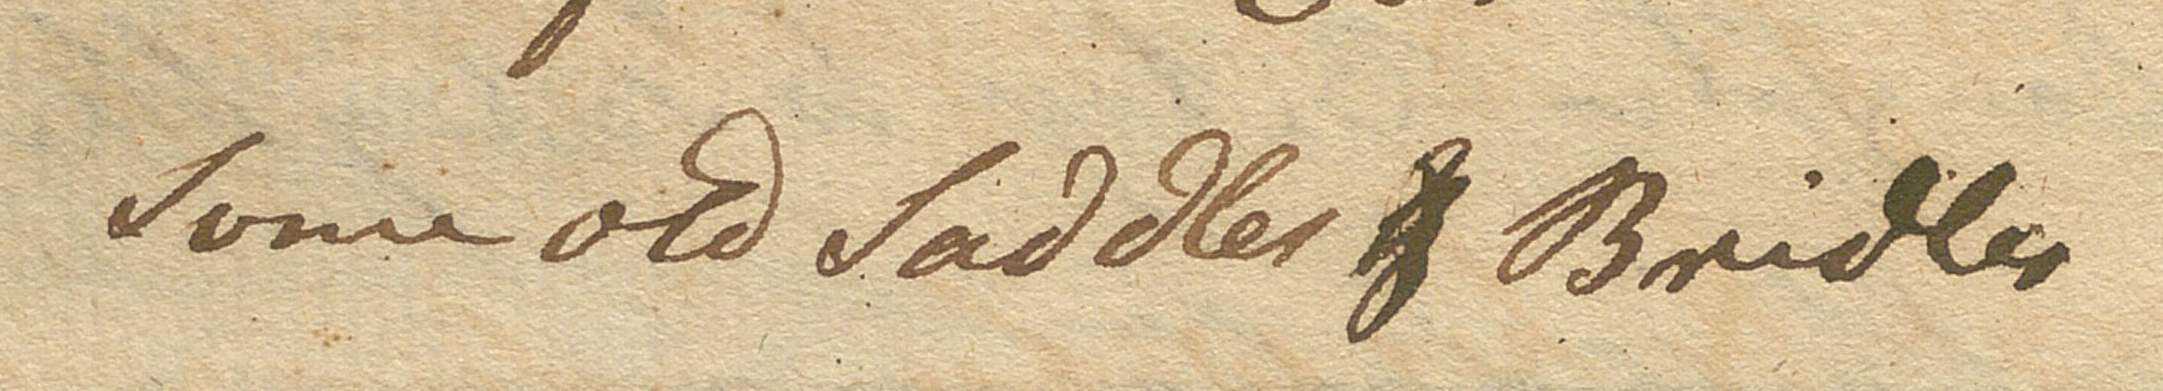some old Saddles & Bridles
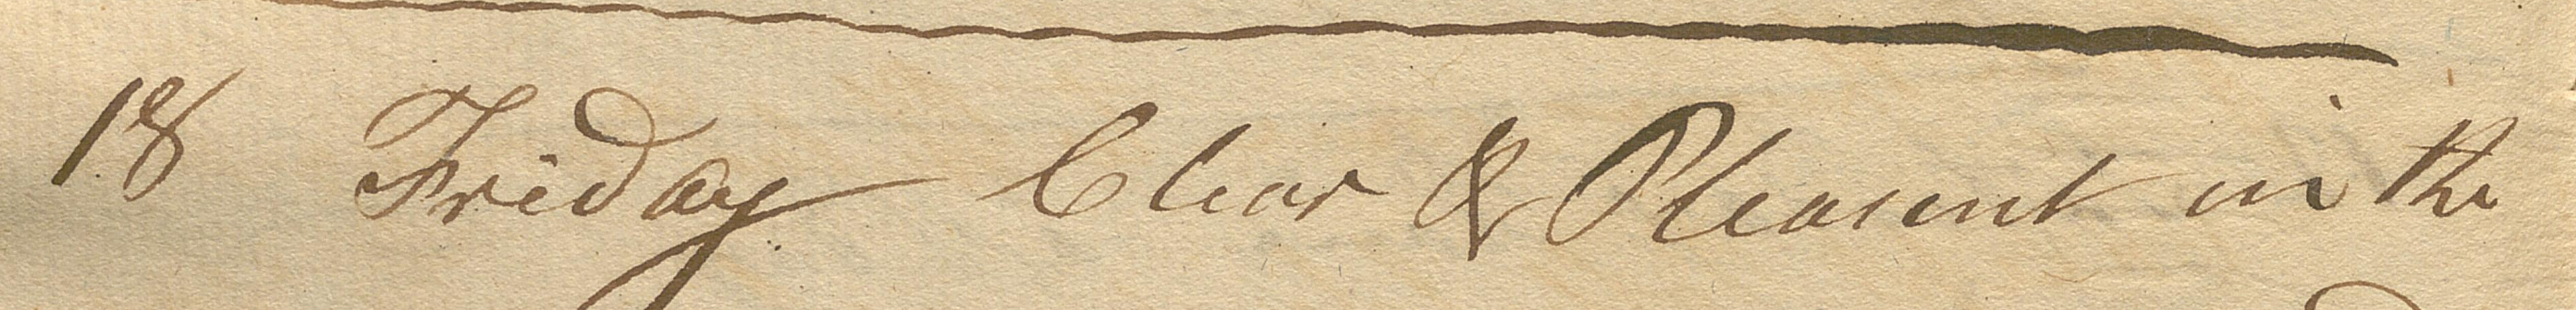18 Friday Clear & Pleasent in the
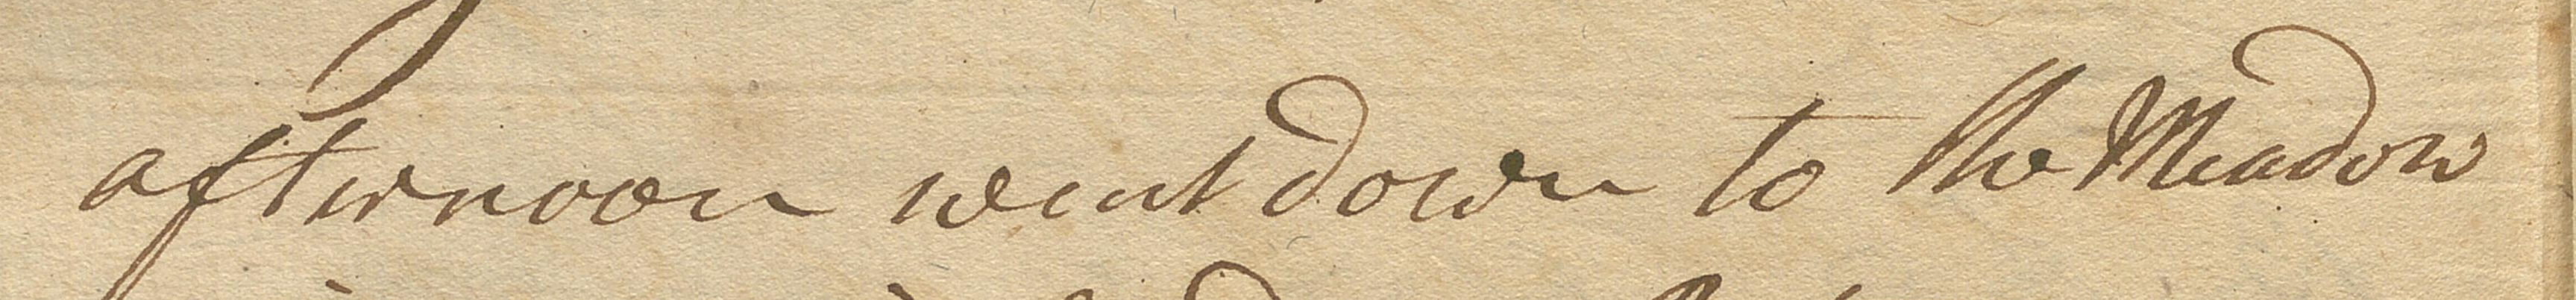afternoon went down to the Meadow
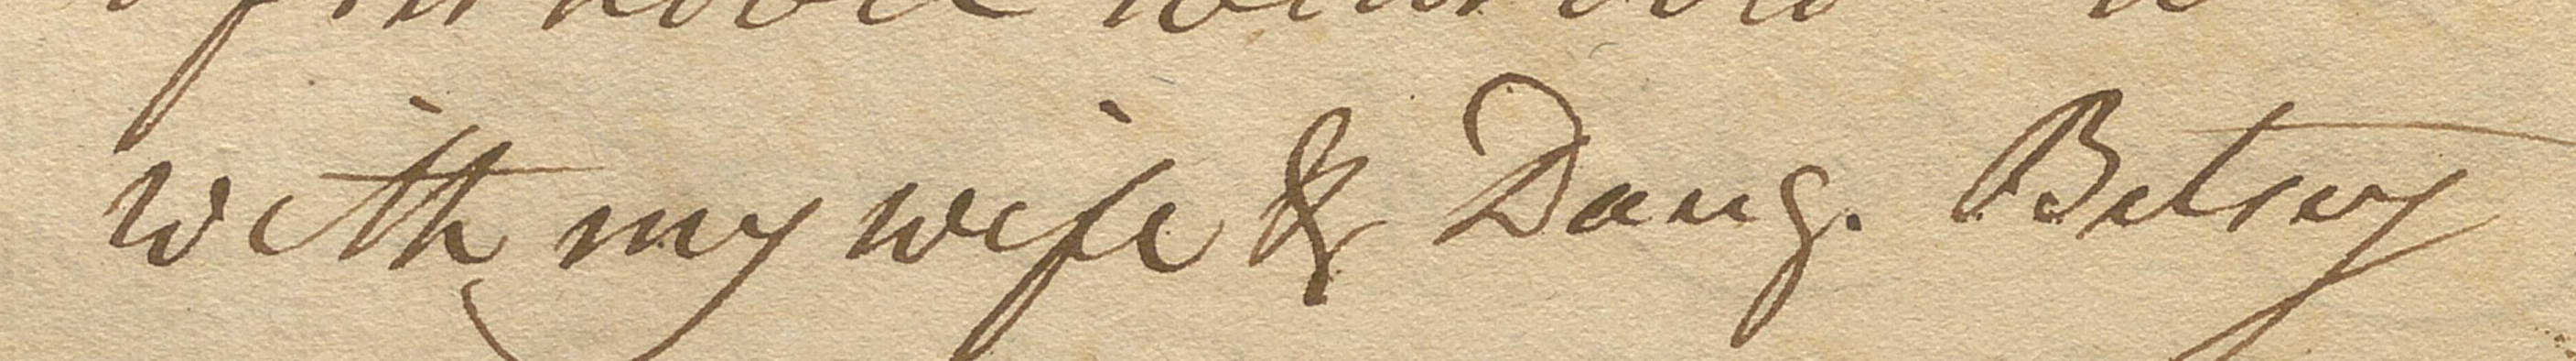with my wife & Daug^r. Betsey
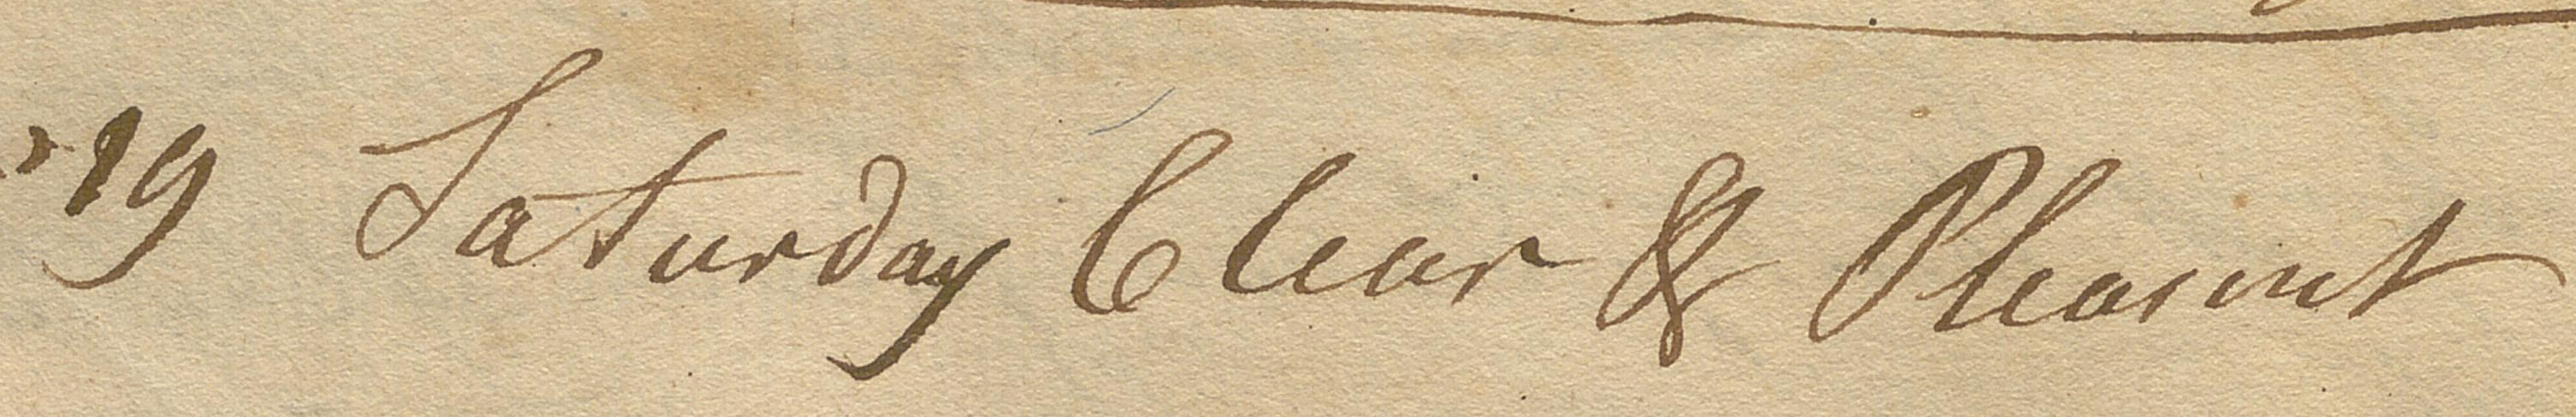19 Saturday Clear & Pleasent
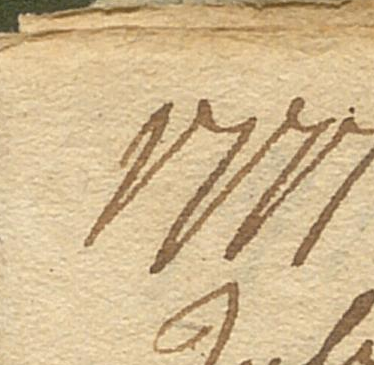1777
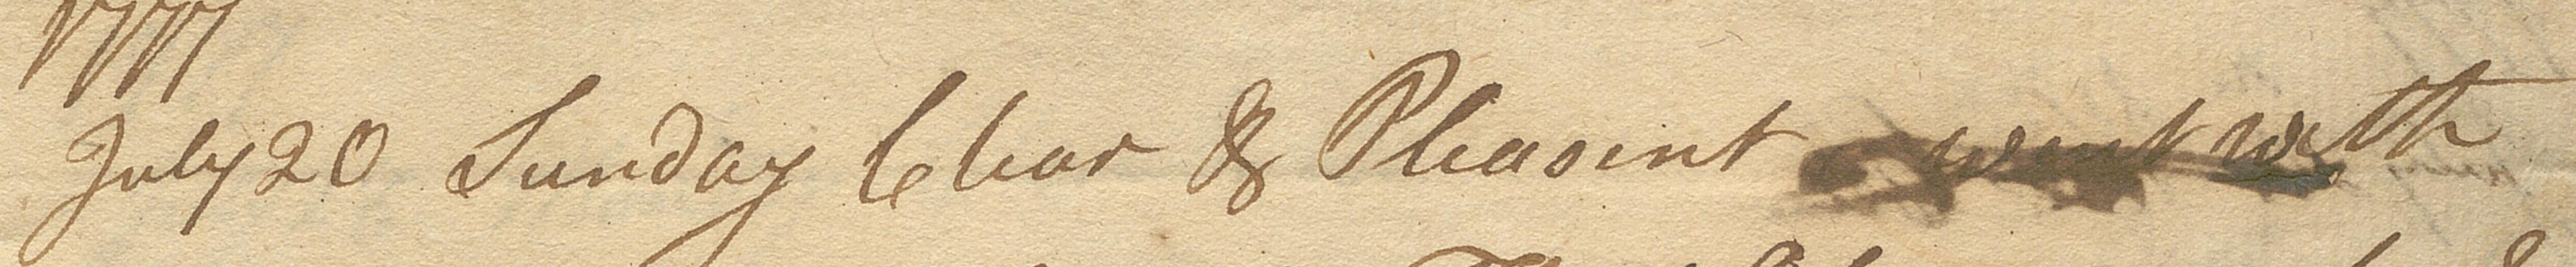July 20 Sunday Clear & Pleasent went with
